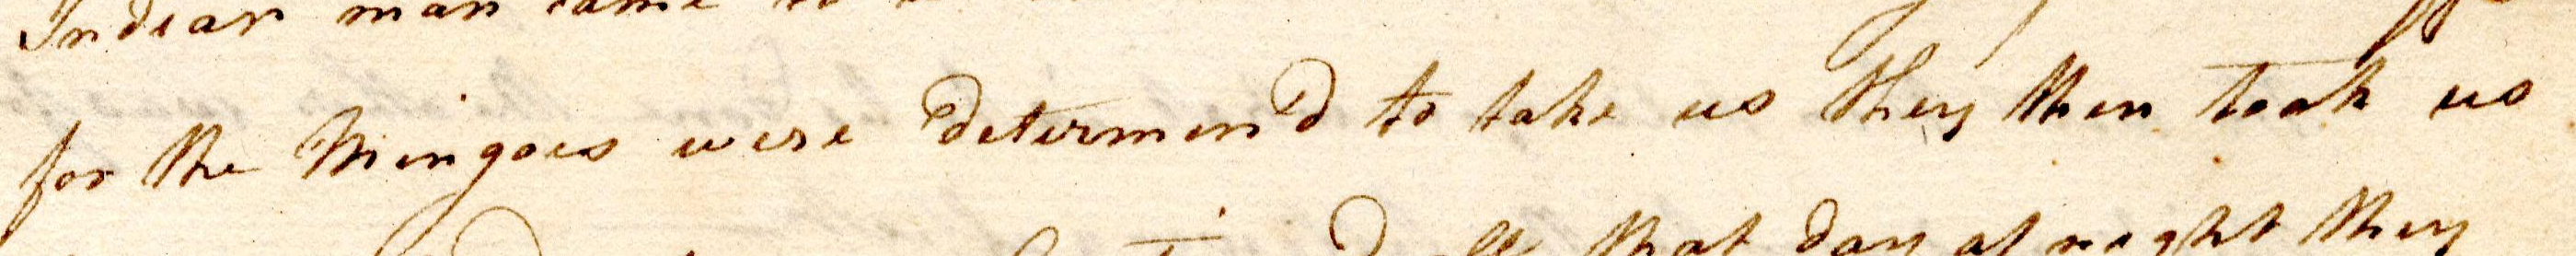for the Mingoes were determin'd to take us they then took us
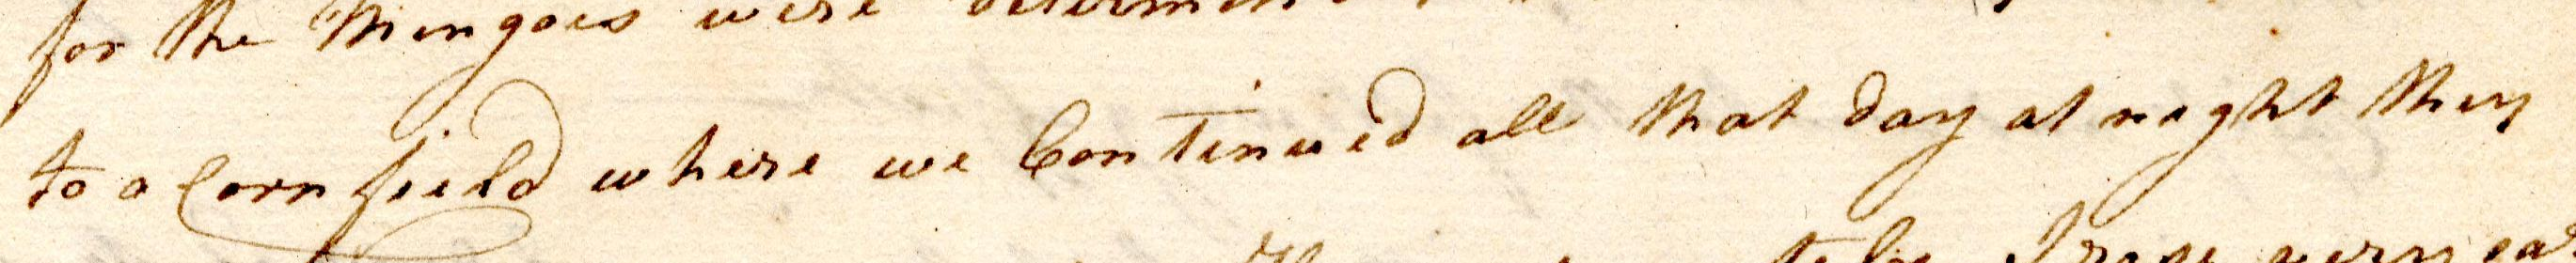to a Cornfield where we Continued all that day at night they
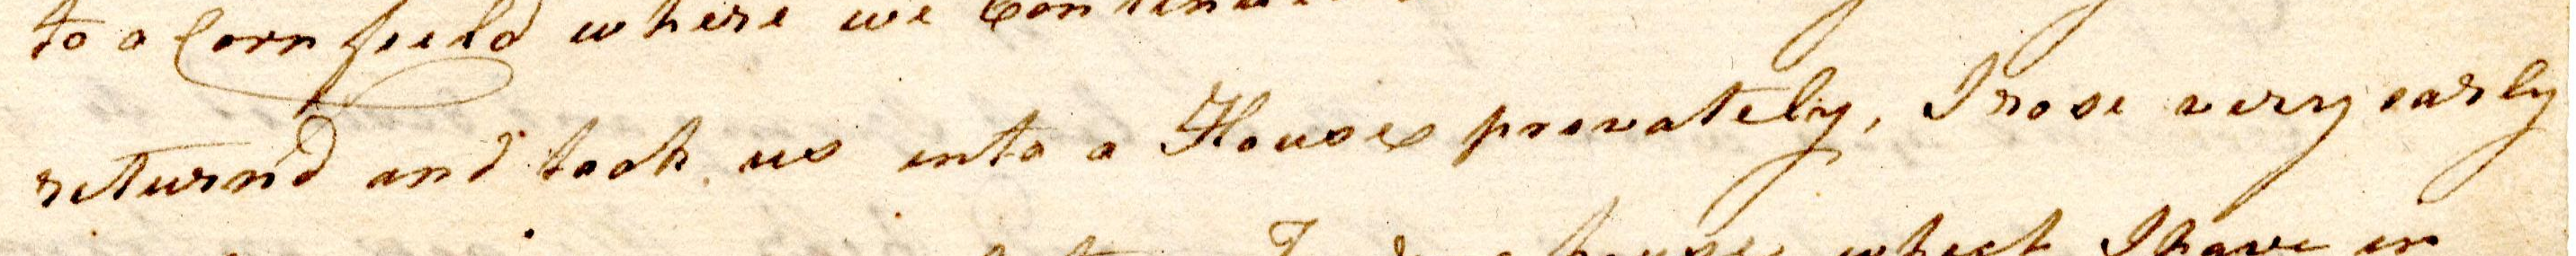return'd and took us into a Houses privately, I rose very early
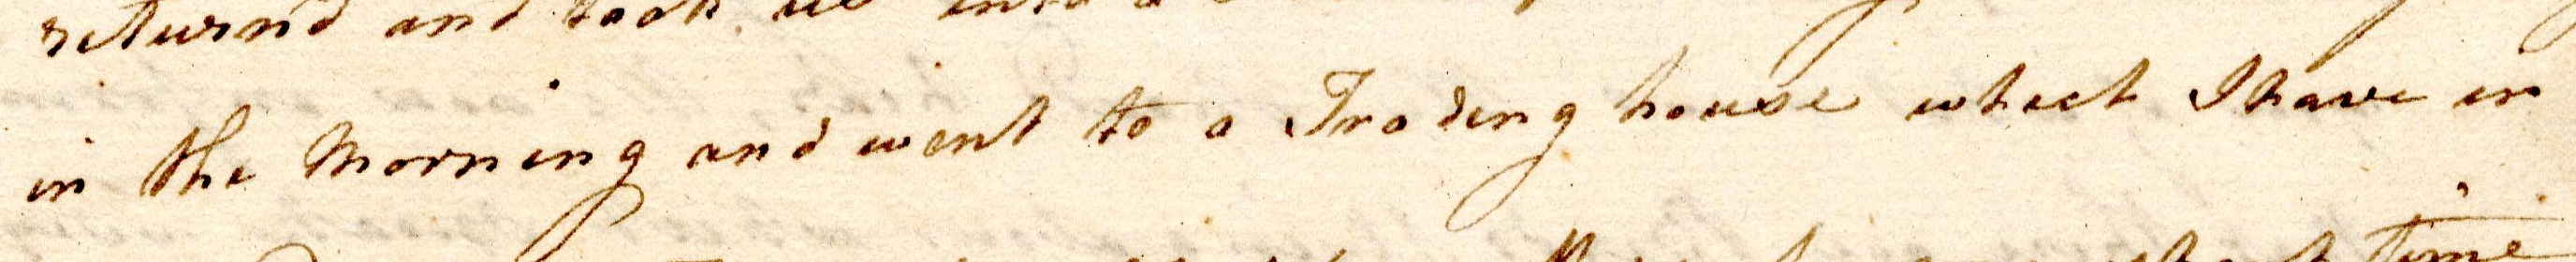in the Morning and went to a Trading house which I have in
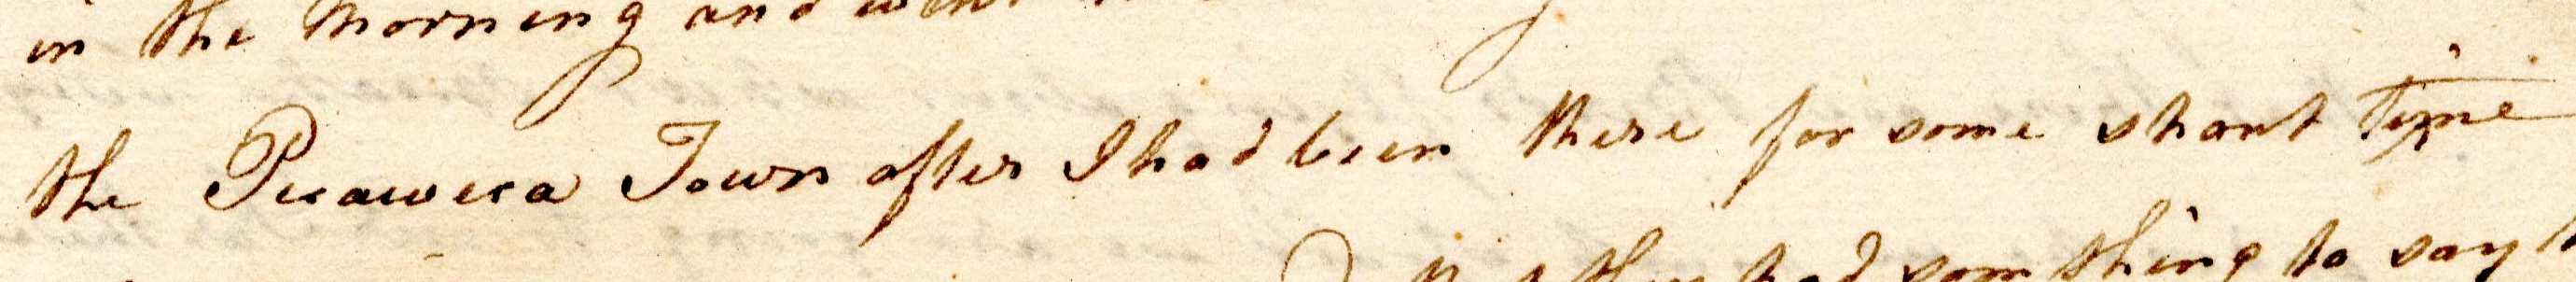the Peiawera Town after I had been there for some short time
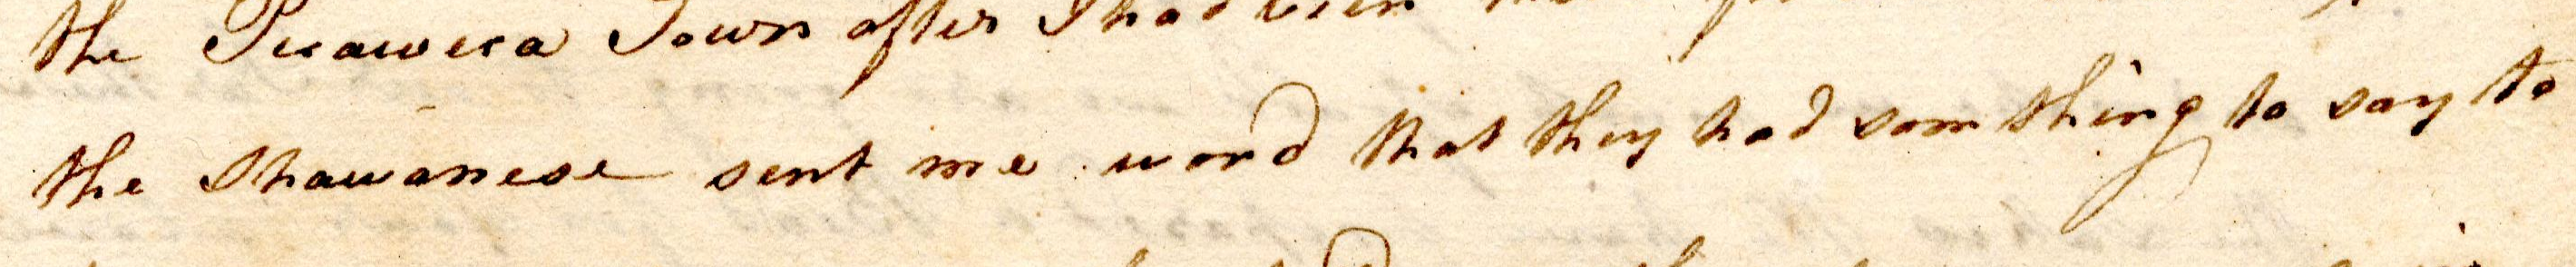the Shawanese sent me word that they had som thing to say to
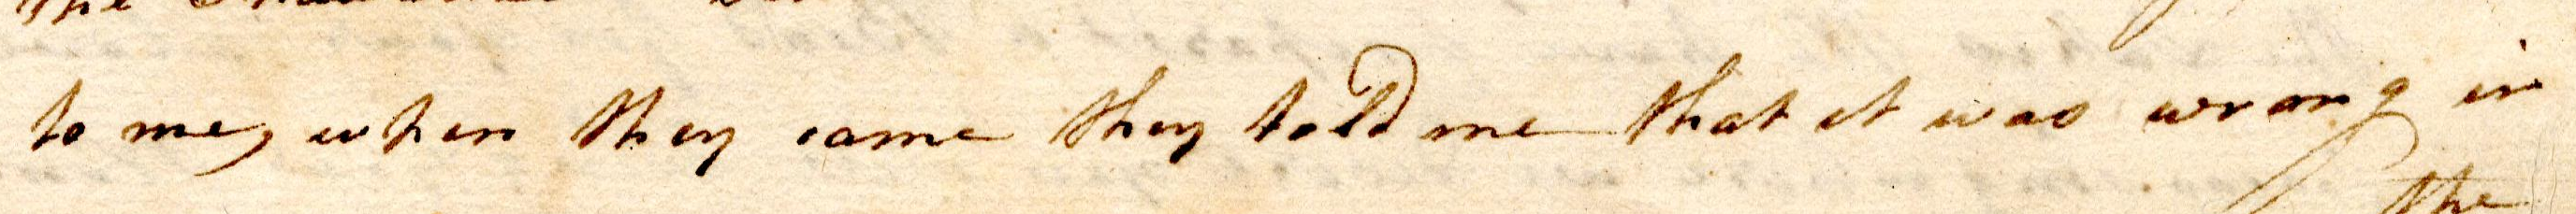to me, when they came they told me that it was wrong in
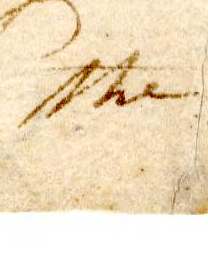the
